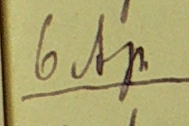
6. April
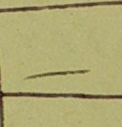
-
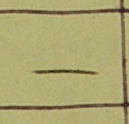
-
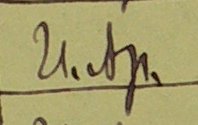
21. April
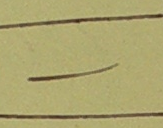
-
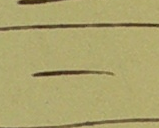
-
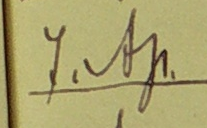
7. April
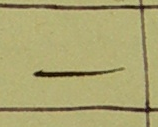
-
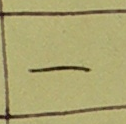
-
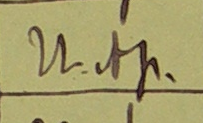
22. April
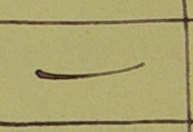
-
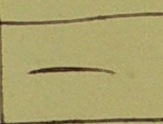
-
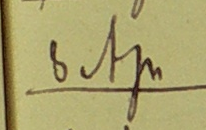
8. April
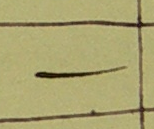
-
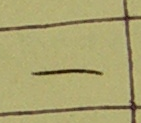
-
